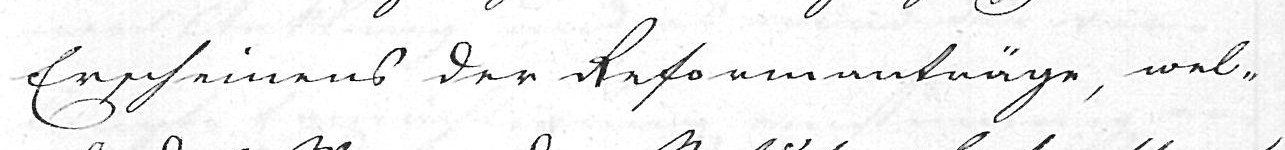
Erscheinens der Reformanträge, wel-
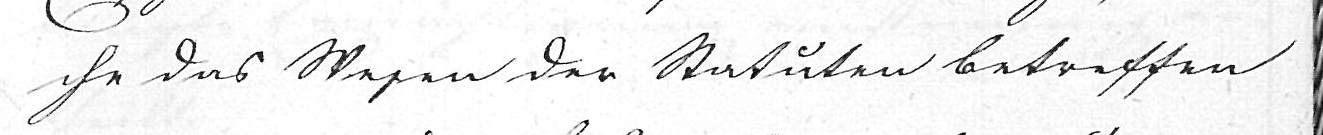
che das Wesen der Statuten betreffen
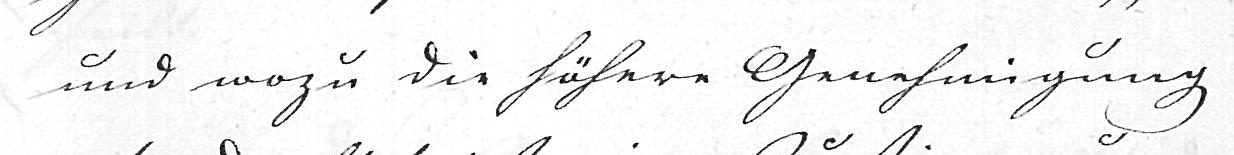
und wozu die höheren Genehmigung
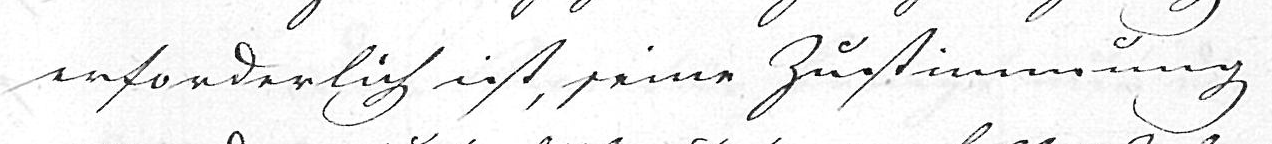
erforderlich ist, seine Zustimmung
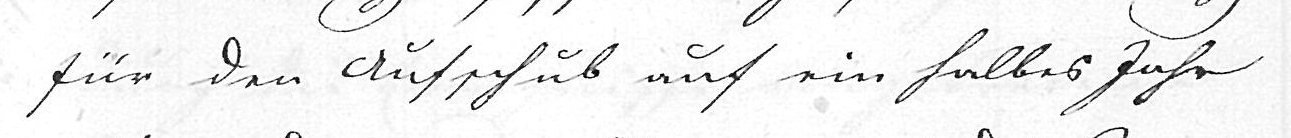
für den Aufschub auf ein halbes Jahr
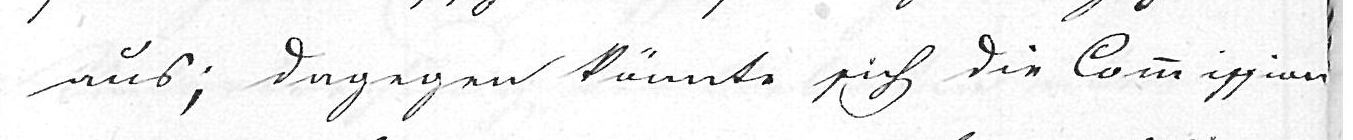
aus; dagegen könnte sich die Commission
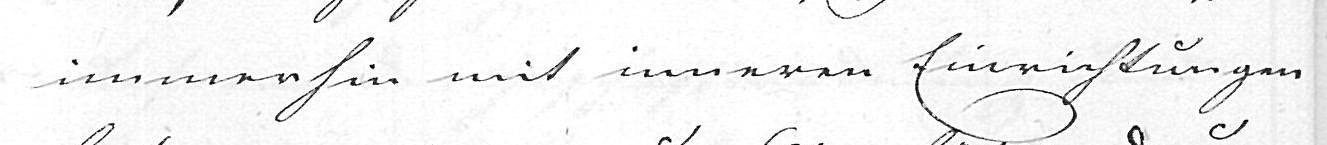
immerhin mit inneren Einrichtungen
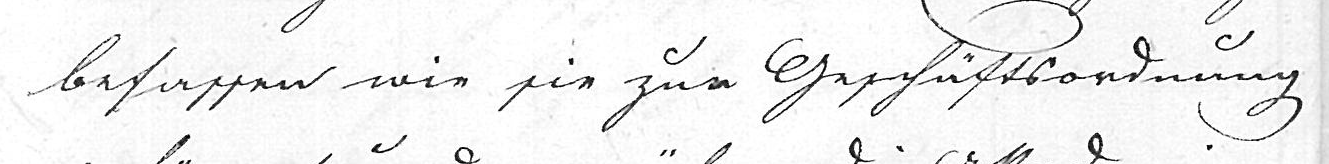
befassen wie sie zur Geschäftsordnung
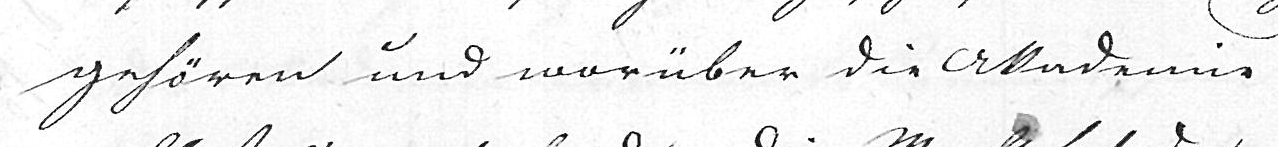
gehören und worüber die Akademie
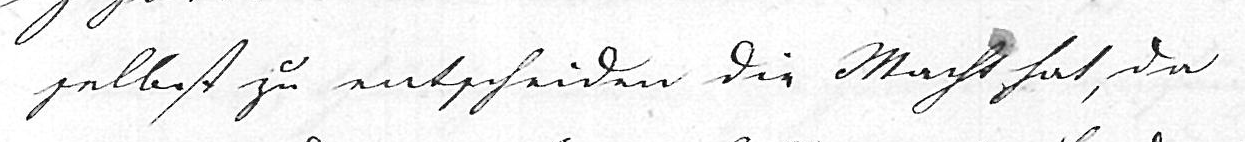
selbst zu entschieden die Macht hat, da
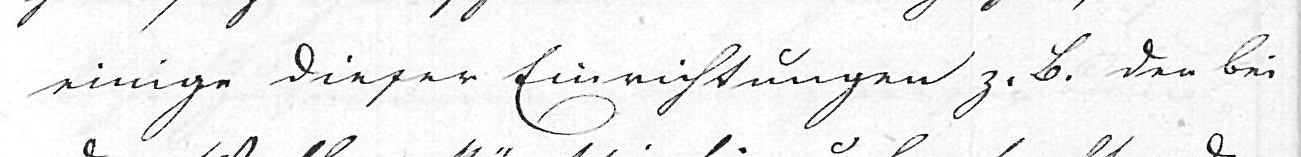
einige dieser Einrichtungen z.B. der bei
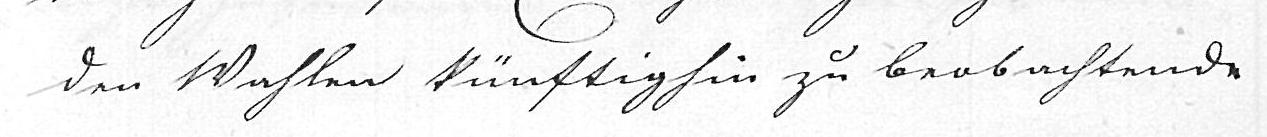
den Wahlen künftighin zu beobachtende
